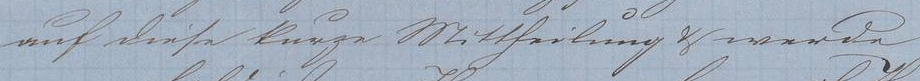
auf diese kurze Mittheilung & werde
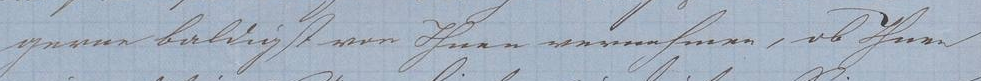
gerne baldigst von Ihnen vernehmen, ob Ihnen
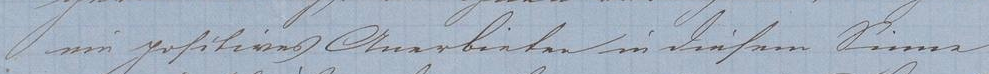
ein positives Anerbieten in diesem Sinne
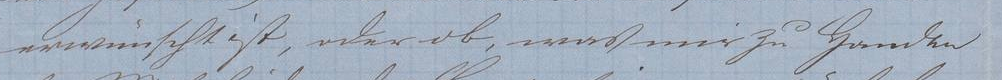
erwünscht ist, oder ob, was mir zu Handen
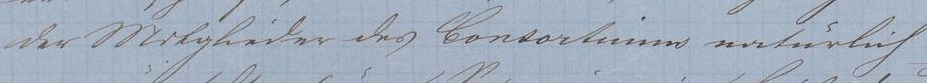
der Mitglieder des Consortiums natürlich
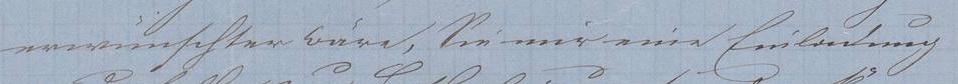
erwünschter wäre, Sie mir eine Einladung
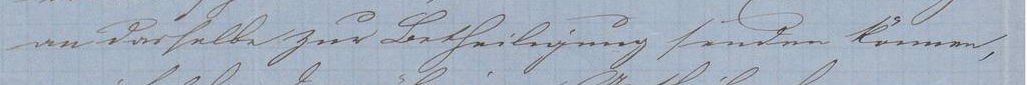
an dasselbe zur Betheiligung senden können,
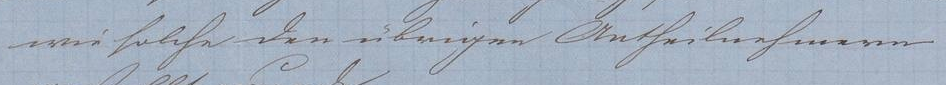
wie solche den übrigen Antheilnehmern
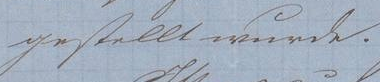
gestellt wurde.
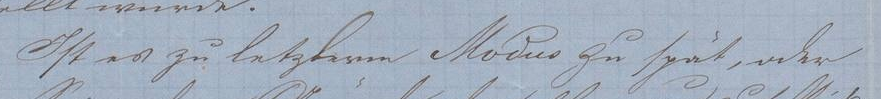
Ist es zu letzterm Modus zu spät, oder
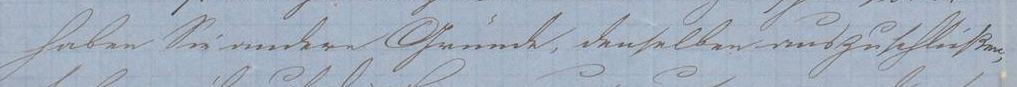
haben Sie andere Gründe, denselben auszuschließen,
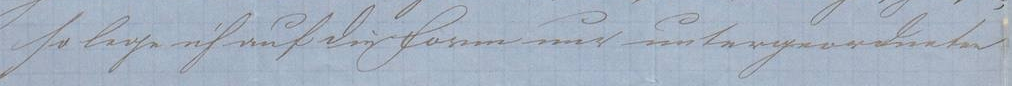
so lege ich auf die Form nur untergeordneten
